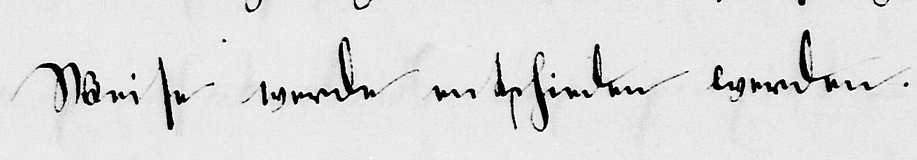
Weise werde entschieden werden.
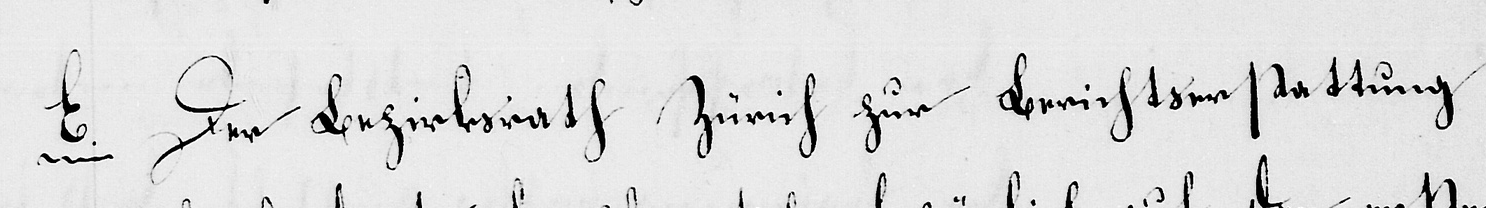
E. Der Bezirksrath Zürich zur Berichtserstattung
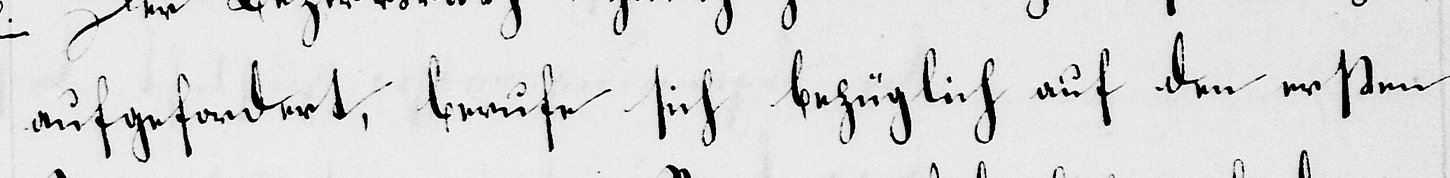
aufgefordert, berufe sich bezüglich auf den ersten
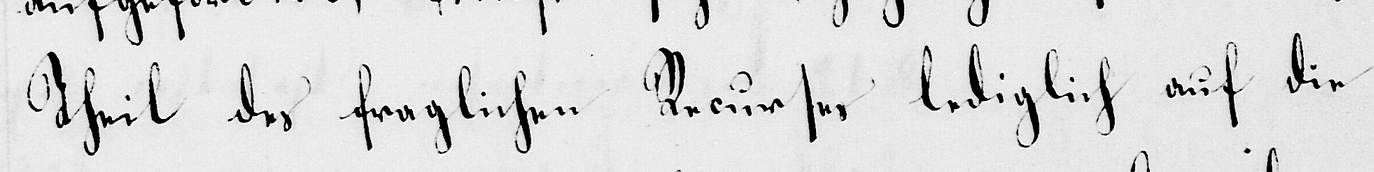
Theil des fraglichen Recurses lediglich auf die
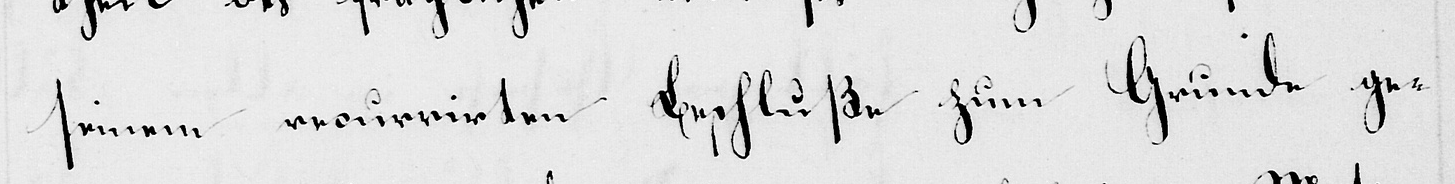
seinem recurrirten Beschluße zum Grunde ge¬
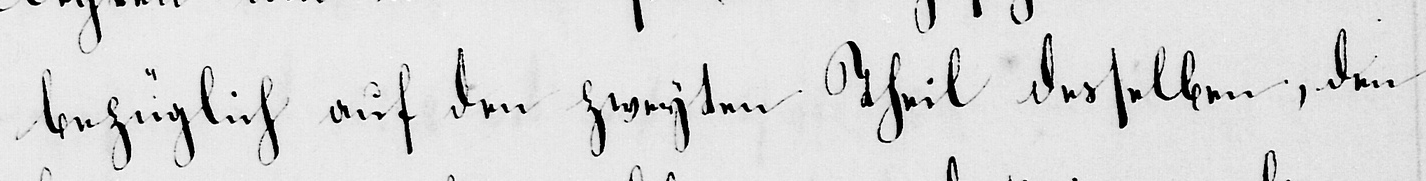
bezüglich auf den zweyten Theil desselben, den
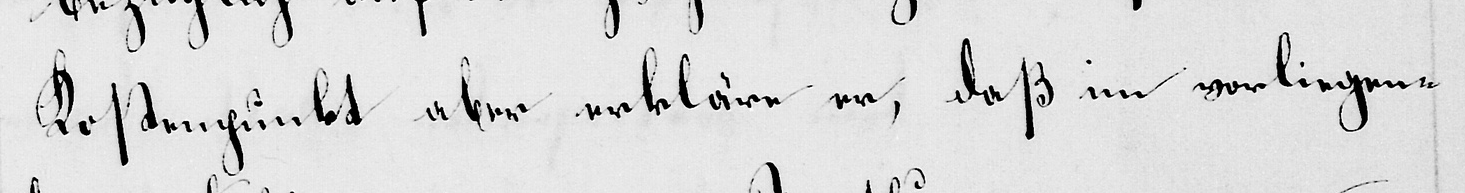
Kostenpunkt aber erkläre er, daß im vorliegen¬
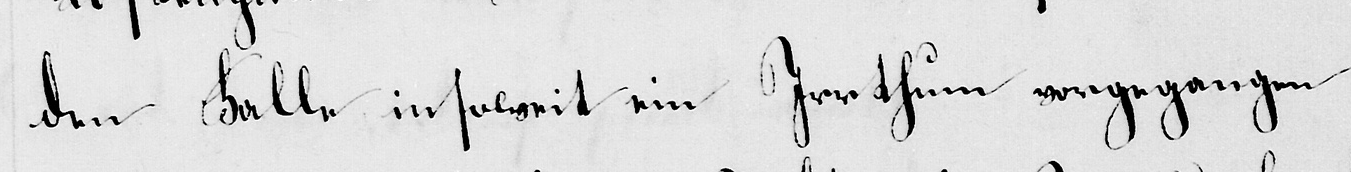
den Falle insoweit ein Irrthum vorgegangen
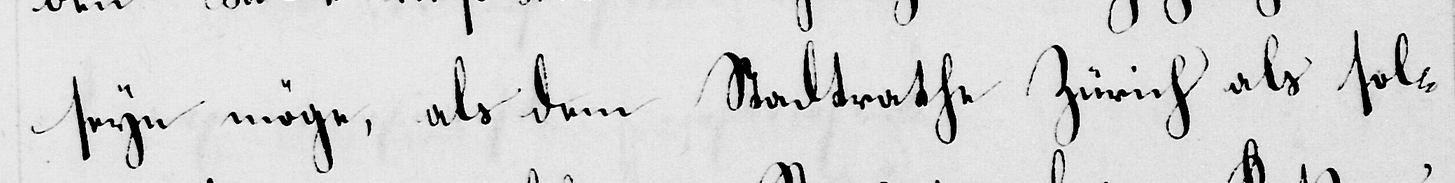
seyn möge, als dem Stadtrathe Zürich als sol¬
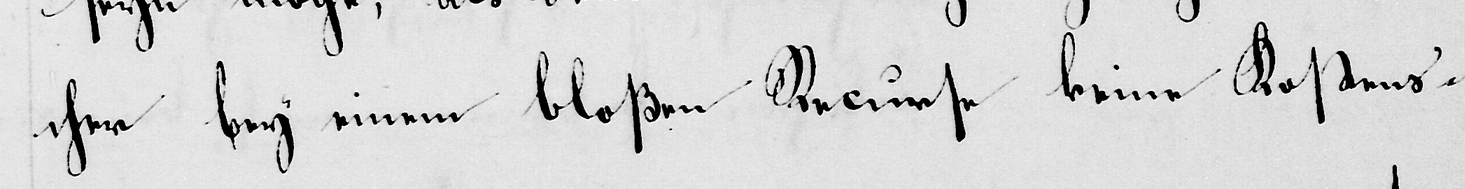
cher bey einem bloßen Recurse keine Kostens-
